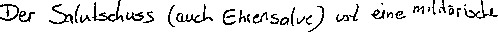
Der Salutschuss (auch Ehrensalve) ist eine militärische
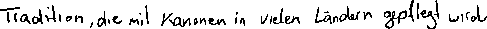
Tradition, die mit Kanonen in vielen Ländern gepflegt wird
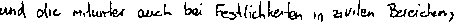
und die mitunter auch bei Festlichkeiten in zivilen Bereichen,
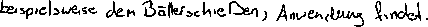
beispielsweise dem Böllerschießen, Anwendung findet.
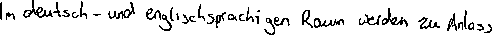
Im deutsch- und englischsprachigen Raum werden zu Anlass
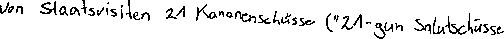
von Staatsvisiten 21 Kanonenschüsse ("21-gun Salutschüsse
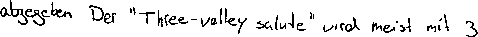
abgegeben. Der "Three-volley salute" wird meist mit 3
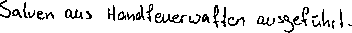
Salven aus Handfeuerwaffen ausgeführt.
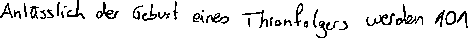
Anlässlich der Geburt eines Thronfolgers werden 101
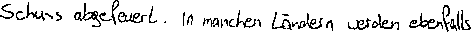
Schuss abgefeuert. In manchen Ländern werden ebenfalls
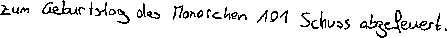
zum Geburtstag des Monarchen 101 Schuss abgefeuert.
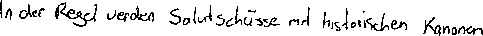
In der Regel werden Salutschüsse mit historischen Kanonen
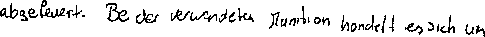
abgefeuert. Bei der verwendeten Munition handelt es sich um
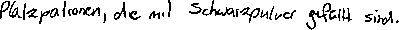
Platzpatronen, die mit Schwarzpulver gefüllt sind.
